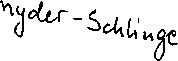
Snyder-Schlinge
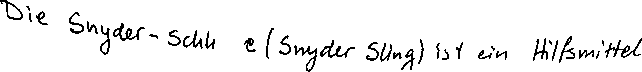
Die Snyder-Schlinge (Snyder Sling) ist ein Hilfsmittel
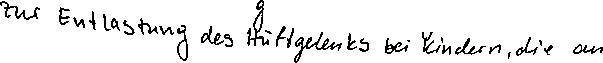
zur Entlastung des Hüftgelenks bei Kindern, die an
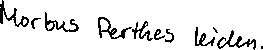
Morbus Perthes leiden.
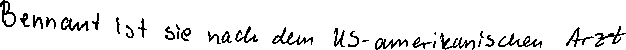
Benannt ist sie nach dem US-amerikanischen Arzt
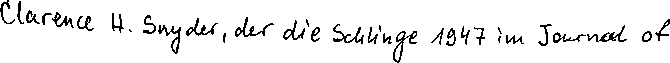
Clarence H. Snyder, der die Schlinge 1947 im Journal of
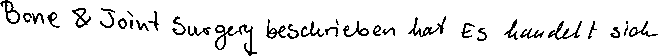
Bone & Joint Surgery beschrieben hat. Es handelt sich
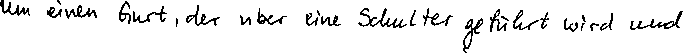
um einen Gurt, der über eine Schulter geführt wird und
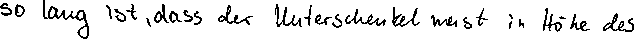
so lang ist, dass der Unterschenkel meist in Höhe des
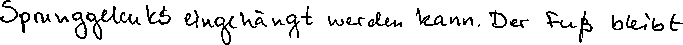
Sprunggelenks eingehängt werden kann. Der Fuß bleibt
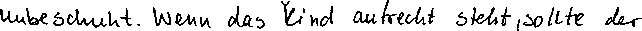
unbeschuht. Wenn das Kind aufrecht steht, sollte der
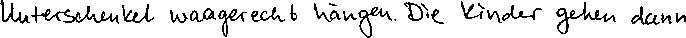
Unterschenkel waagerecht hängen. Die Kinder gehen dann
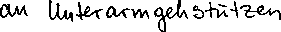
an Unterarmgehstützen
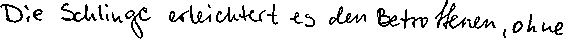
Die Schlinge erleichtert es den Betroffenen, ohne
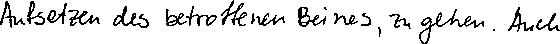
Aufsetzen des betroffenen Beines, zu gehen. Auch
